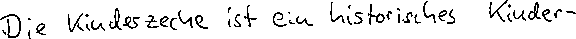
Die Kinderzeche ist ein historisches Kinder-
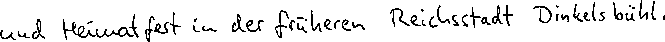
und Heimatfest in der früheren Reichsstadt Dinkelsbühl.
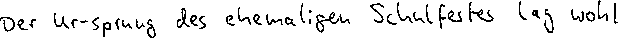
Der Ursprung des ehemaligen Schulfestes lag wohl
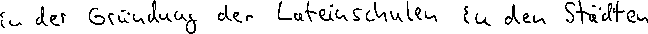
in der Gründung der Lateinschulen in den Städten
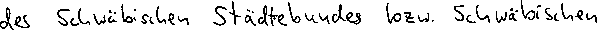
des Schwäbischen Städtebundes bzw. Schwäbischen
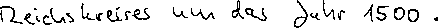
Reichskreises um das Jahr 1500.
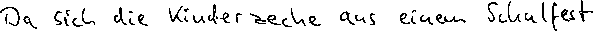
Da sich die Kinderzeche aus einem Schulfest
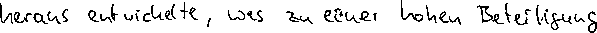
heraus entwickelte, was zu einer hohen Beteiligung
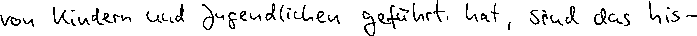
von Kindern und Jugendlichen geführt hat, sind das his-
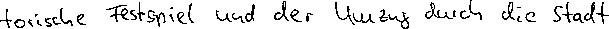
torische Festspiel und der Umzug durch die Stadt
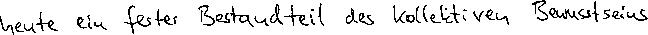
heute ein fester Bestandteil des kollektiven Bewusstseins
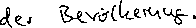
der Bevölkerung.
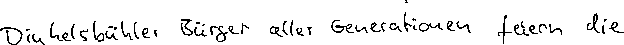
Dinkelsbühler Bürger aller Generationen feiern die
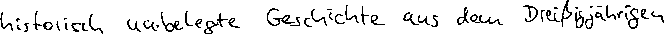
historisch unbelegte Geschichte aus dem Dreißigjährigen
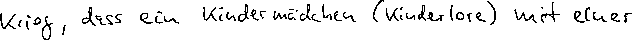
Krieg, dass ein Kindermädchen (Kinderlore) mit einer
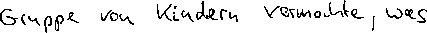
Gruppe von Kindern vermochte, was
